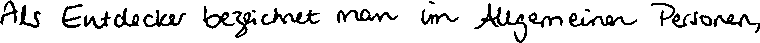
Als Entdecker bezeichnet man im Allgemeinen Personen,
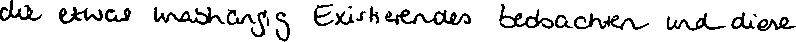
die etwas unabhängig Existierendes beobachten und diese
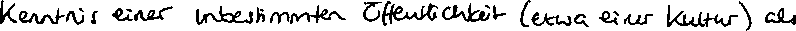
Kenntnis einer unbestimmten Öffentlichkeit (etwa einer Kultur) als
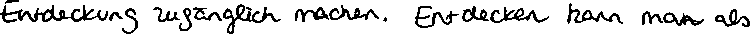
Entdeckung zugänglich machen. Entdecken kann man als
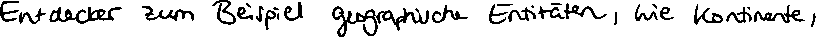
Entdecker zum Beispiel geographische Entitäten, wie Kontinente,
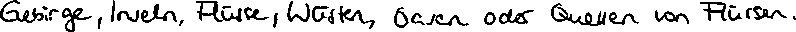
Gebirge, Inseln, Flüsse, Wüsten, Oasen oder Quellen von Flüssen.
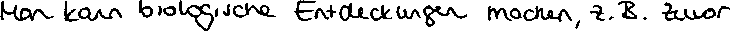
Man kann biologische Entdeckungen machen, z. B. zuvor
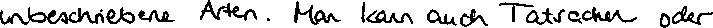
unbeschriebene Arten. Man kann auch Tatsachen oder
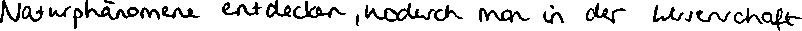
Naturphänomene entdecken, wodurch man in der Wissenschaft
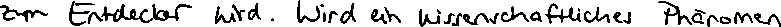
zum Entdecker wird. Wird ein wissenschaftliches Phänomen
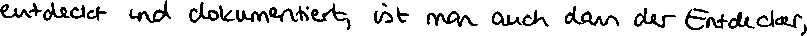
entdeckt und dokumentiert, ist man auch dann der Entdecker,
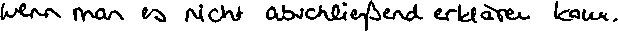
wenn man es nicht abschließend erklären kann.
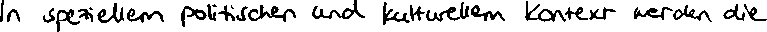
In speziellem politischen und kulturellem Kontext werden die
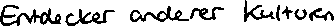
Entdecker anderer Kulturen
